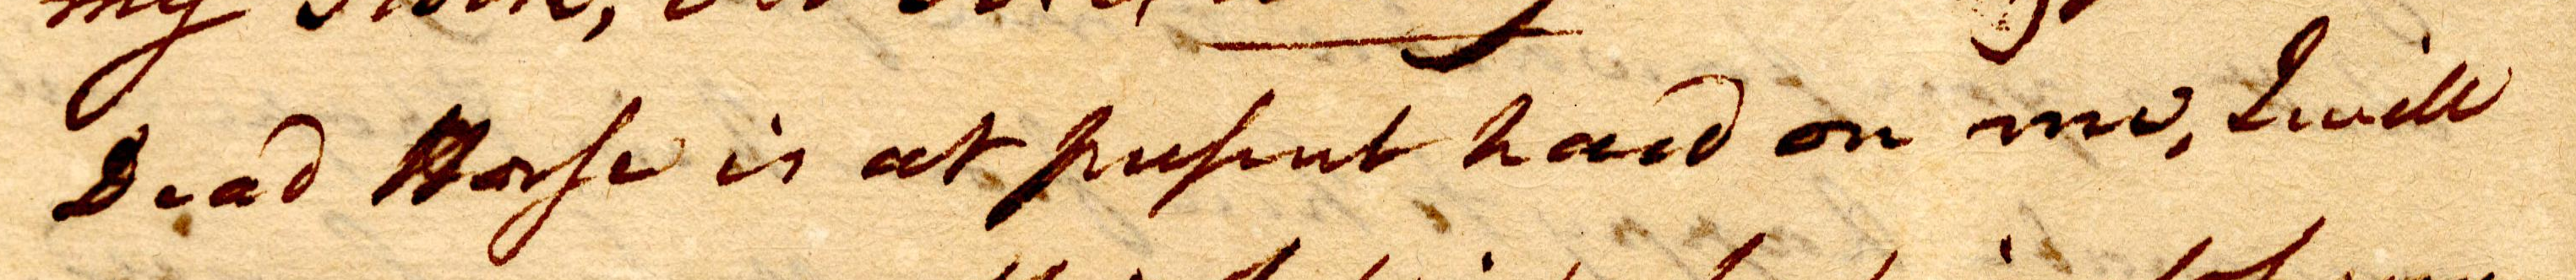Dead Horse is at present hard on me, I will
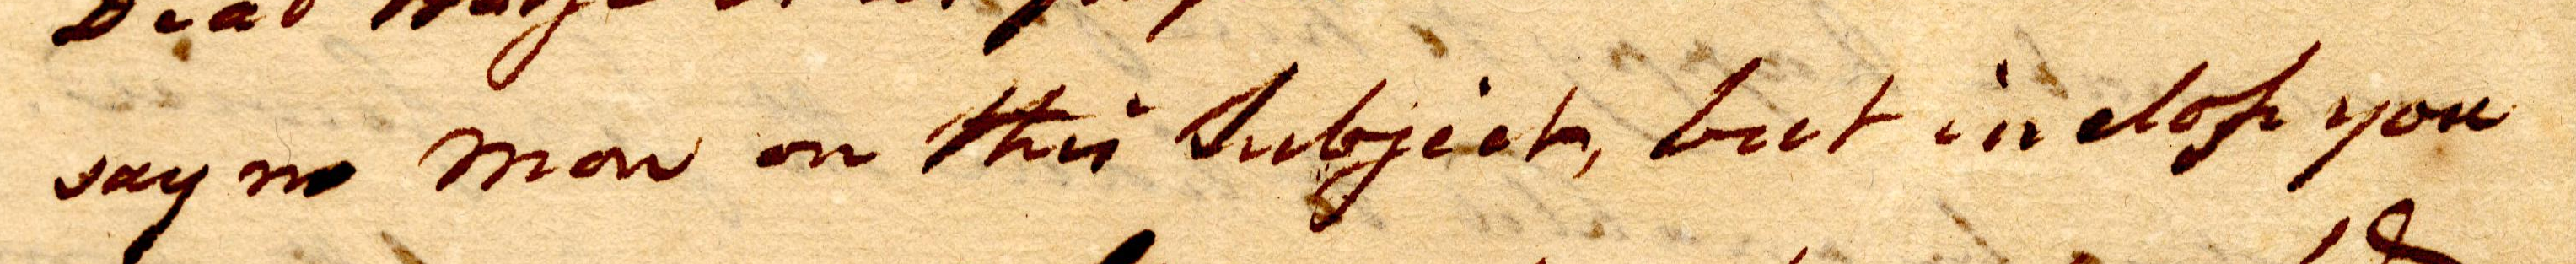say no more on this Subject, but inclose you
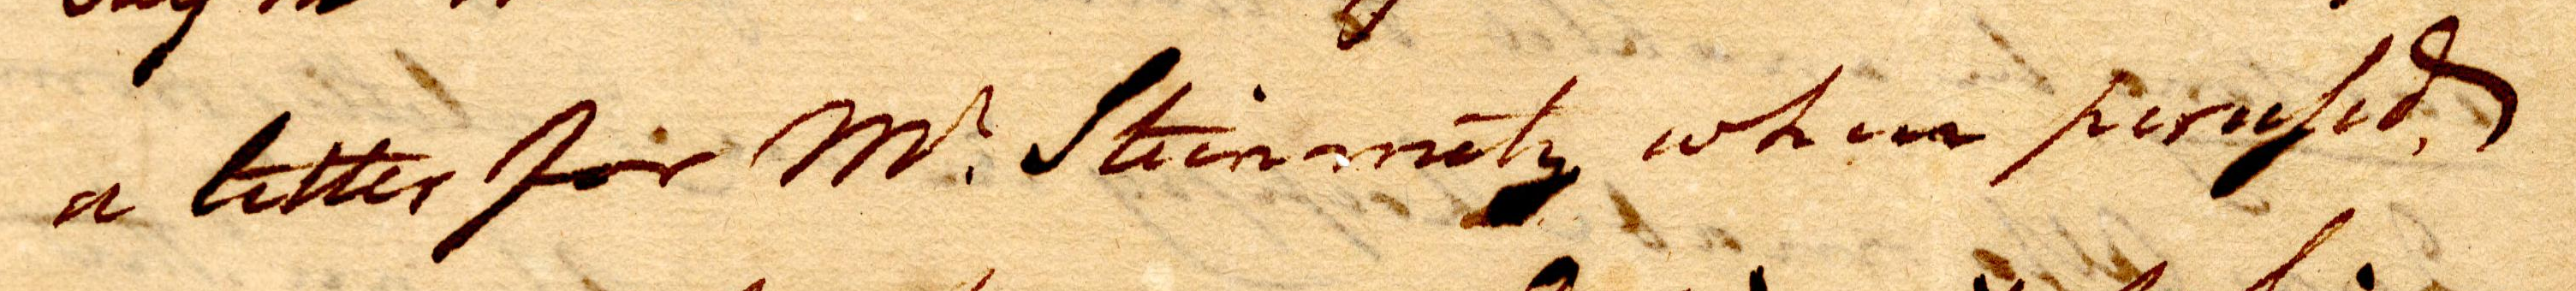a letter for M^r. Stinanety when perused;
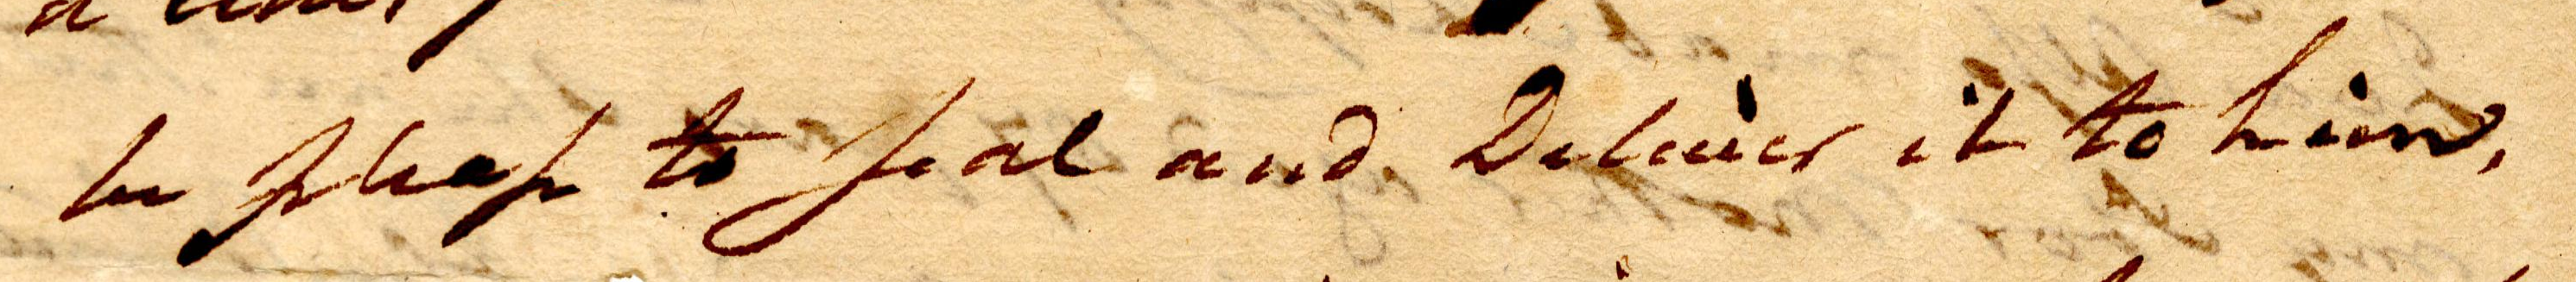be please to seal and Deliever it to him,
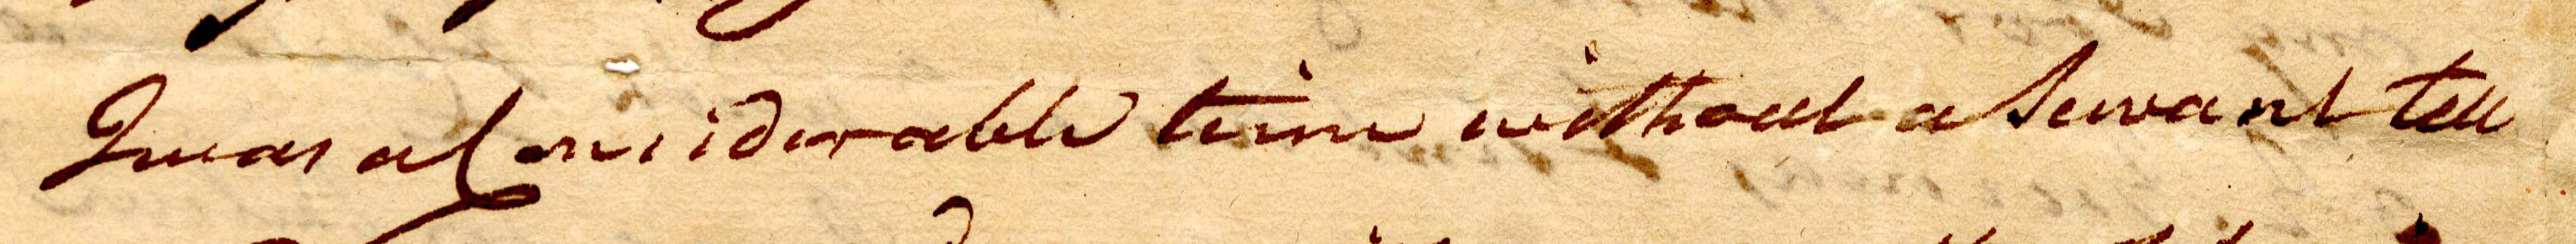I was a considerable time without a Servant tell
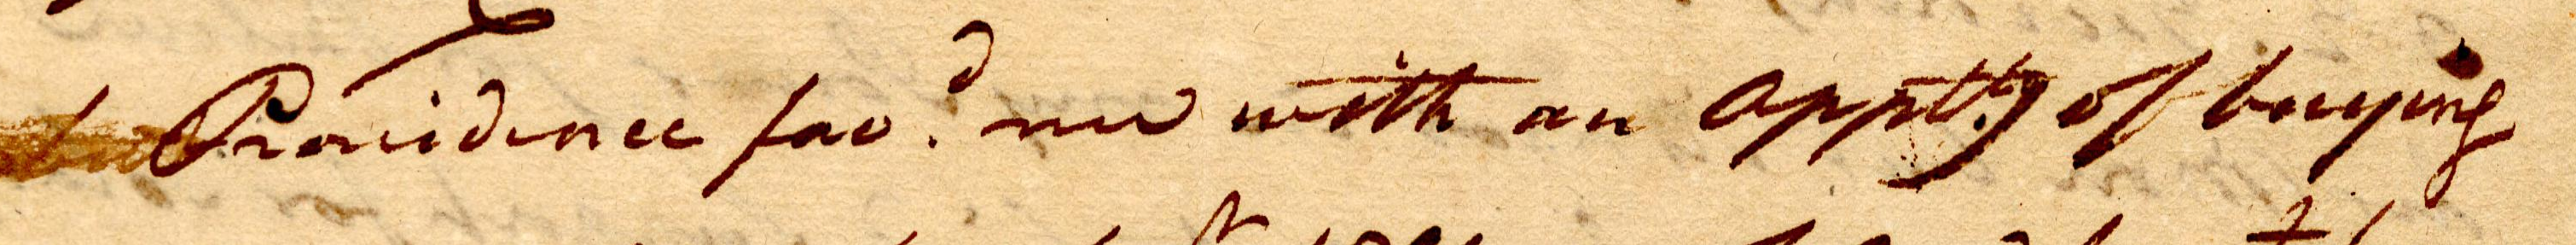but providence fav^d. me with an opp^ty of buying
